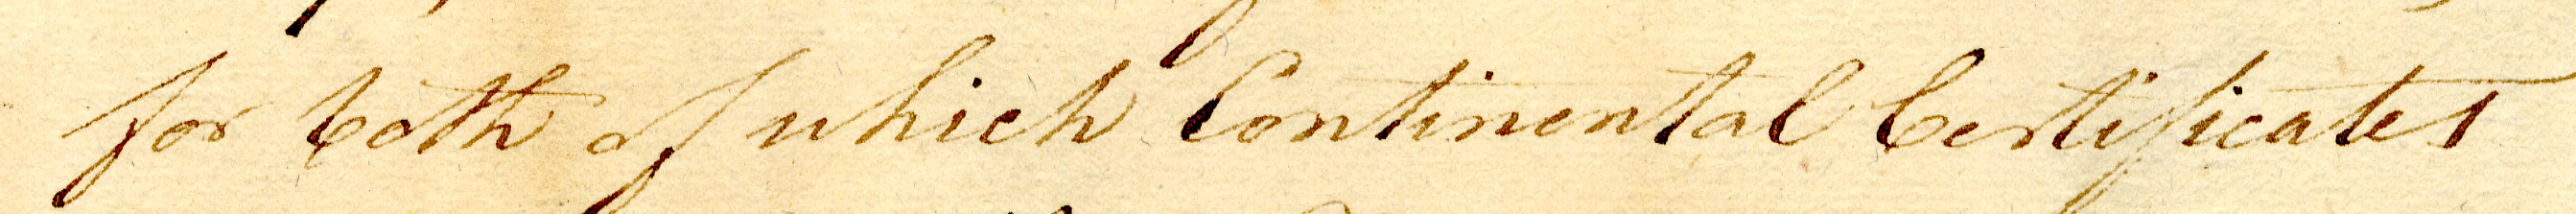for both of which Continental Certificates
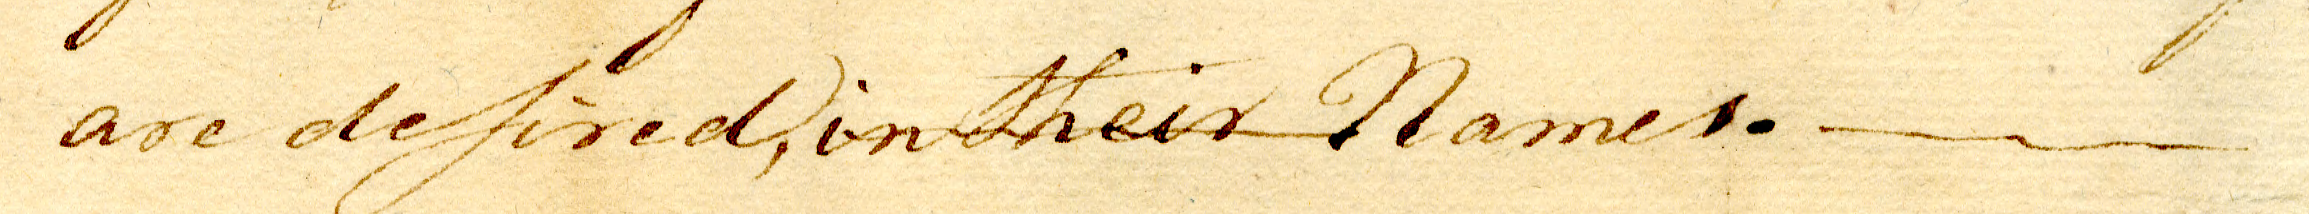are desired in their Names.-
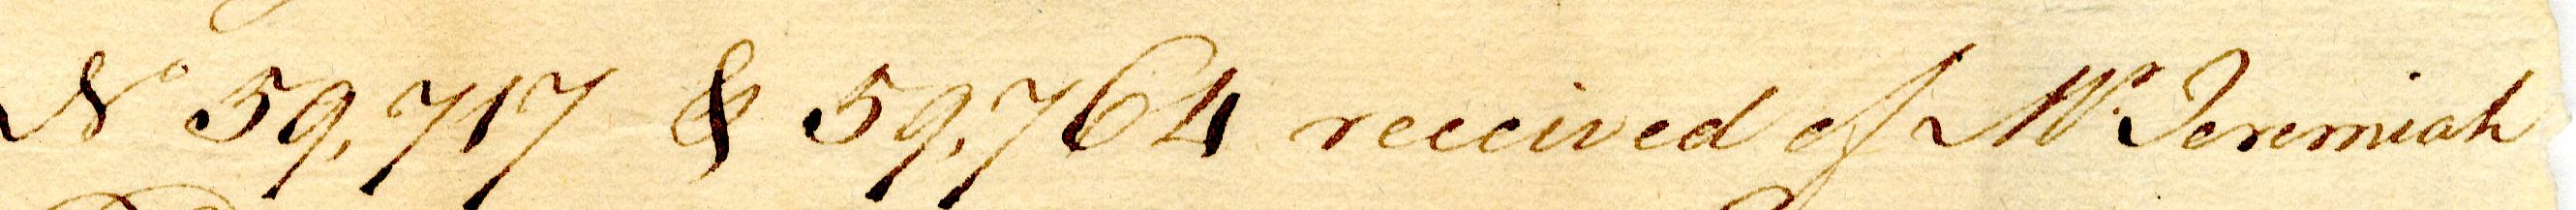N^o 59,717 & 59,764 received of M^r. Jeremiah
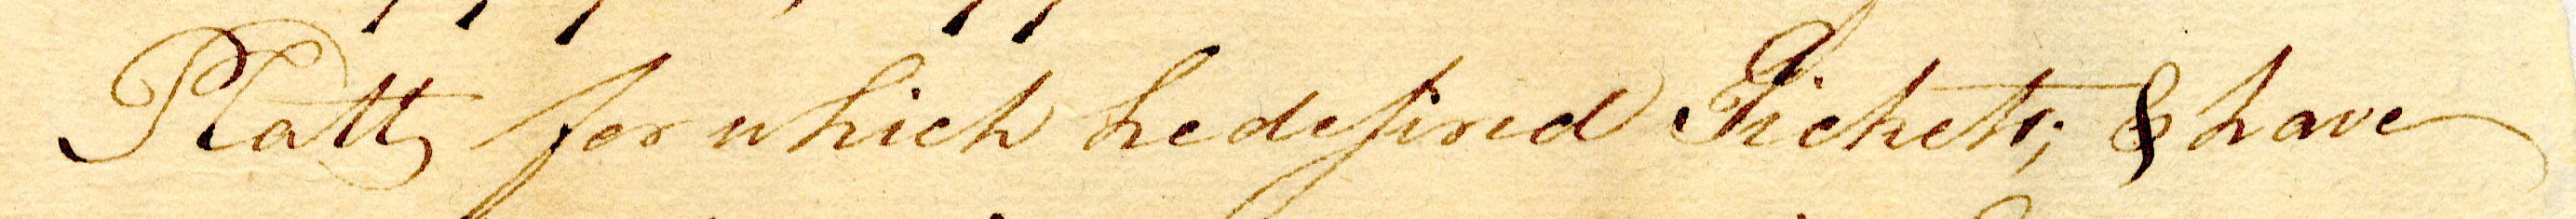Platt for which he desired Tickets; & have
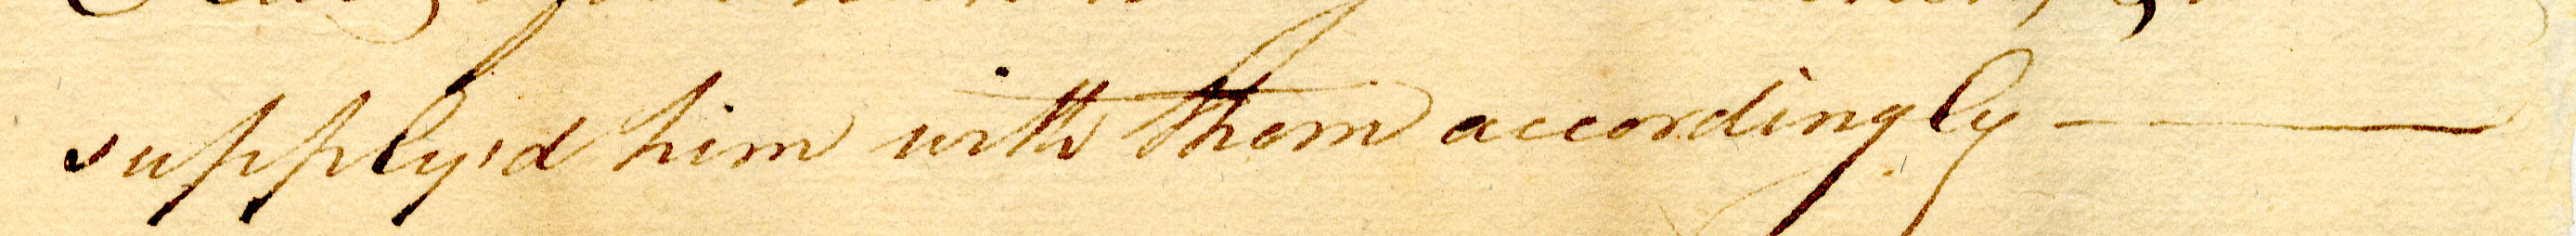supply’d him with them accordingly-
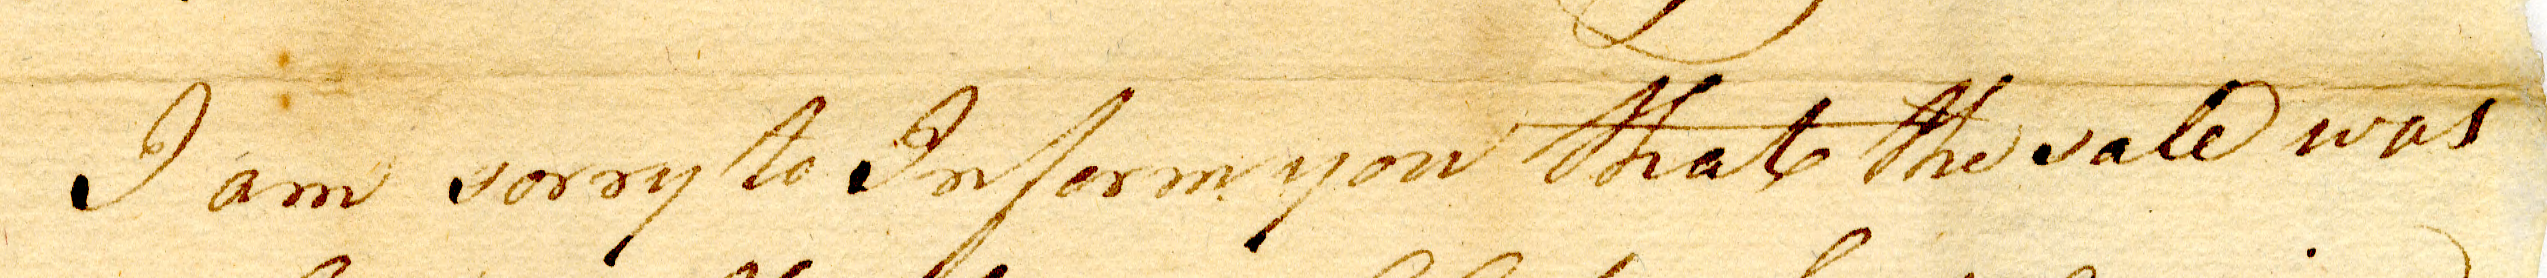I am sorry to inform you that the sale was
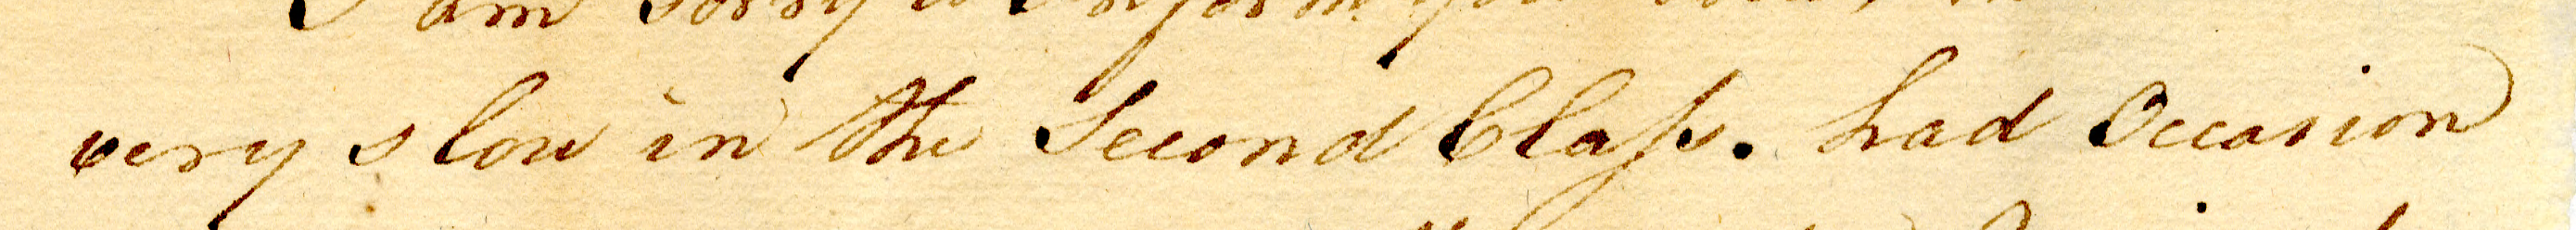very slow in the Second Class. had occasion
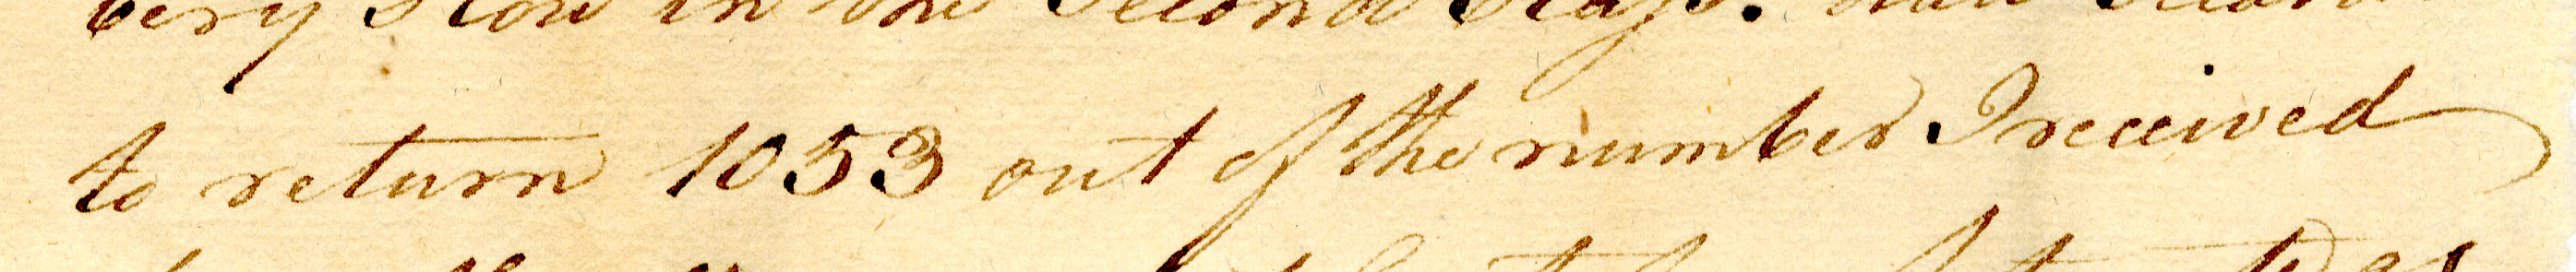to return 1053 out of the number I received
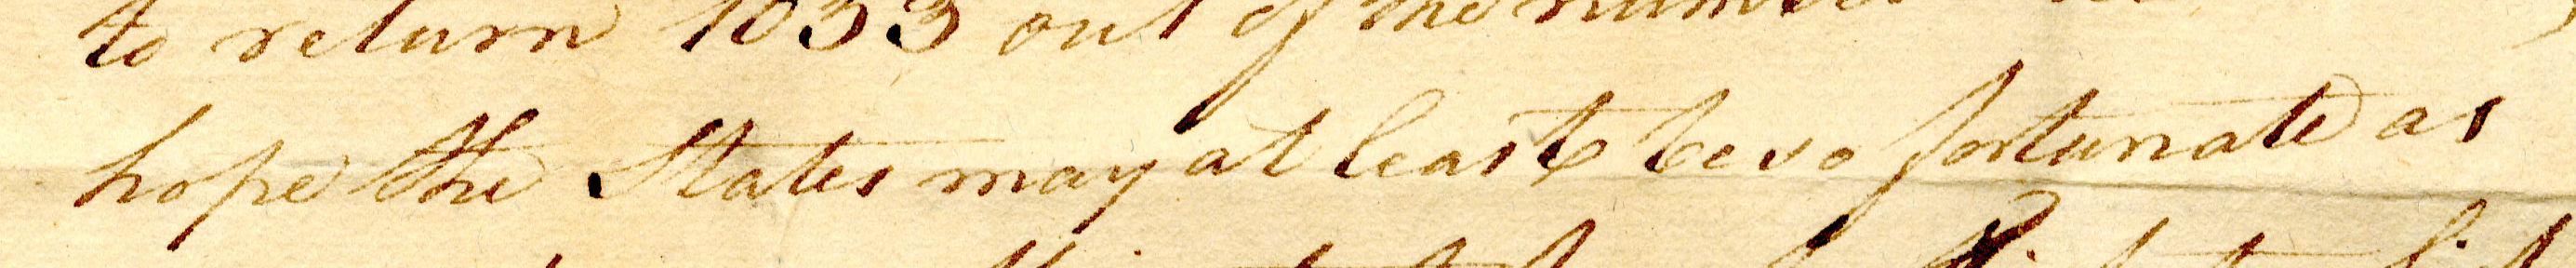hope the states may at least be so fortunate as
